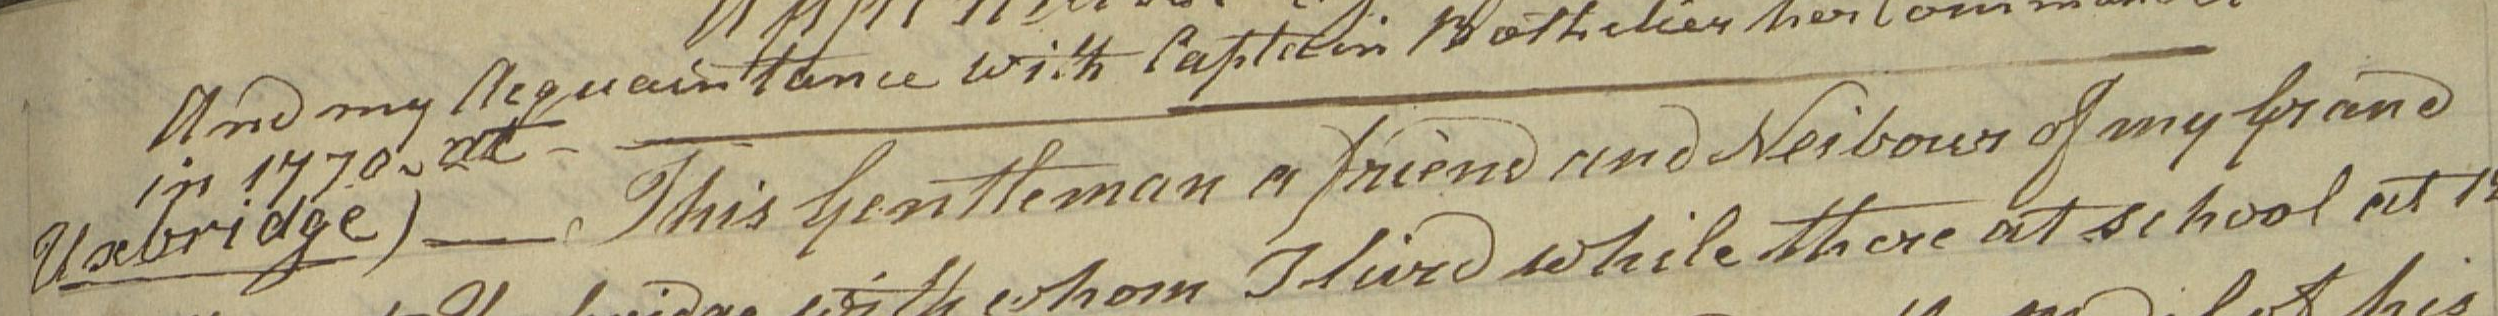Uxbridge) This Gentleman a friend and Neibour of my Grand
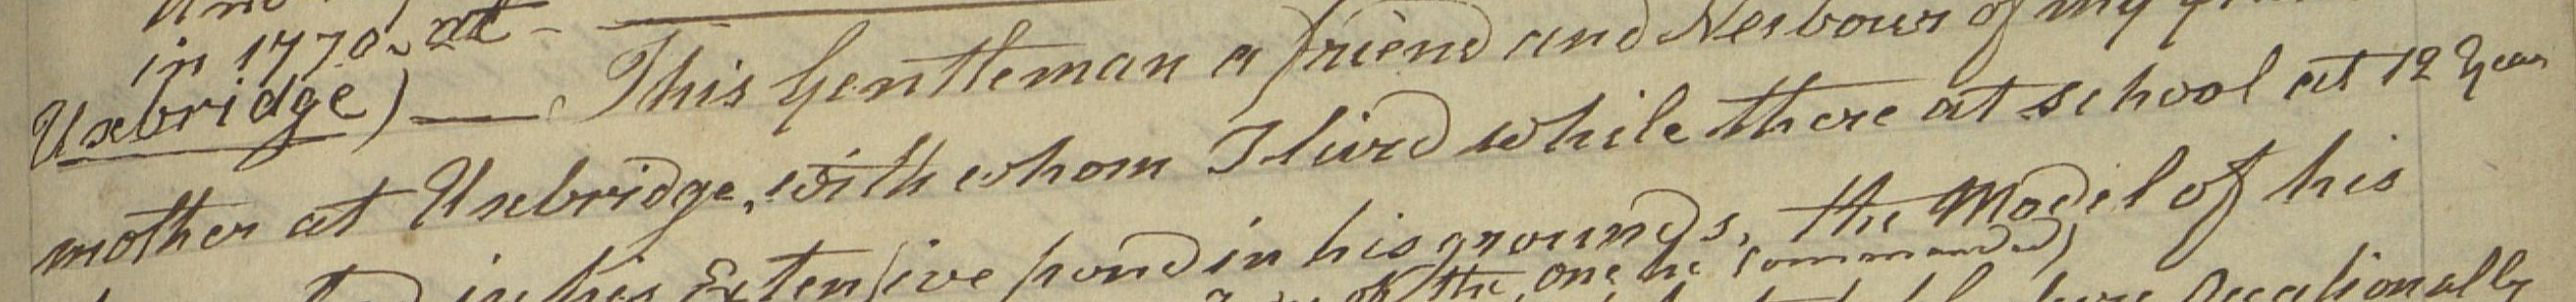mother at Uxbridge with whom I lurd while there at school at 12 year
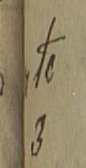3
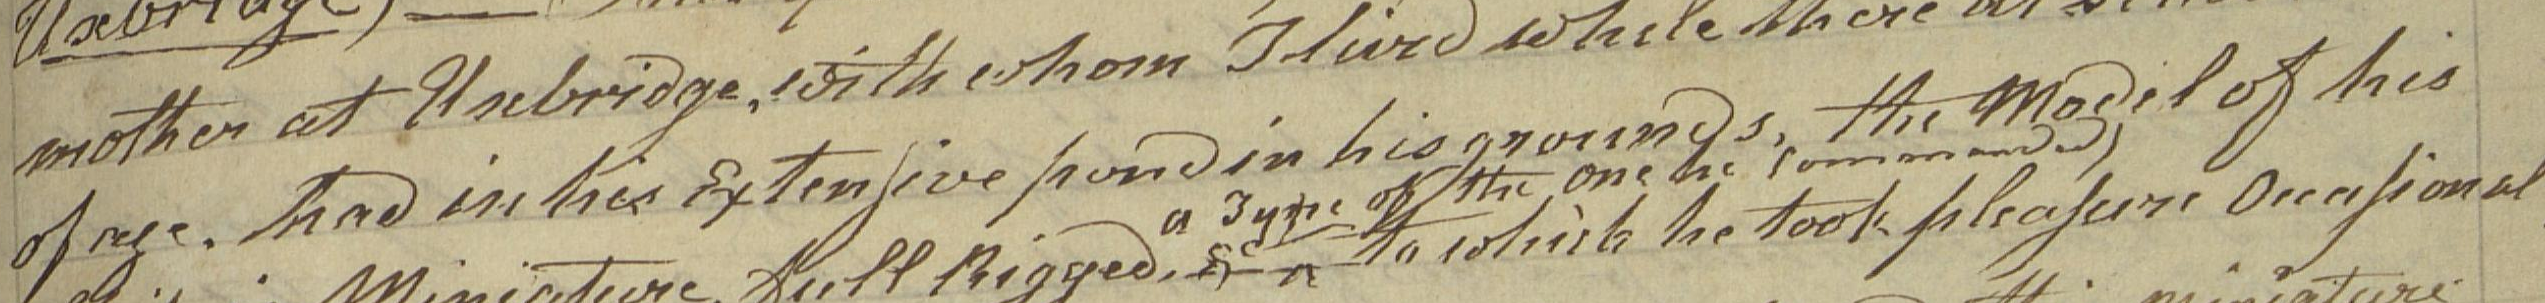of age. had in his extensive in his grounds, the model of his
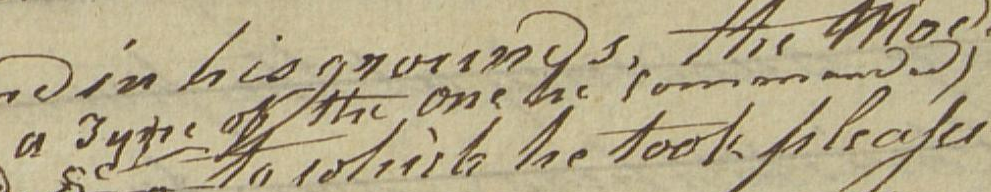a Type of the one he commanded
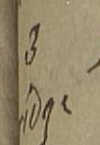-dge
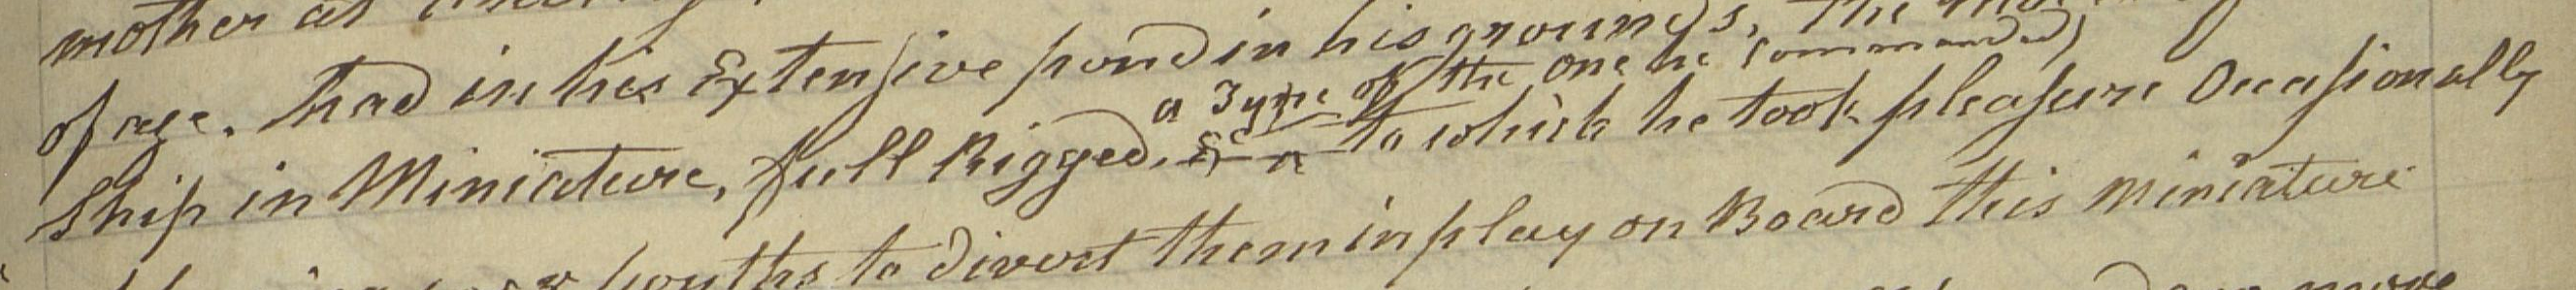Ship in Miniature, full Rigged^ ^ to which he took pleasure Occasionally
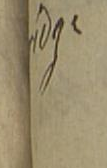-dge
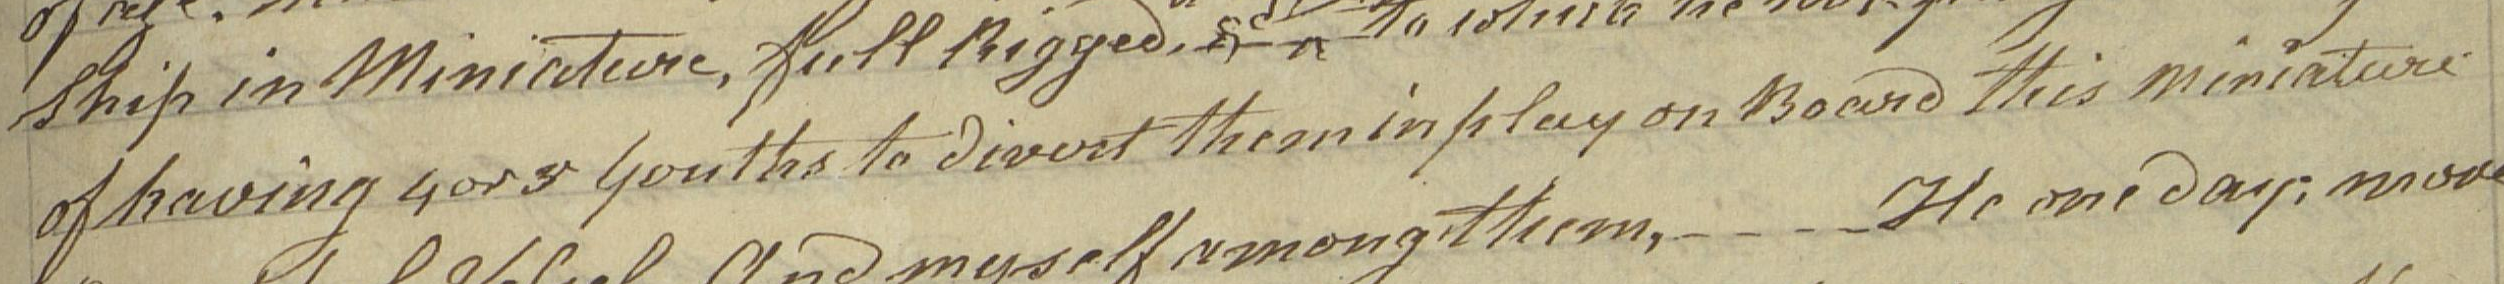of having 4 or 5 Youths to divert them in play on Board this miniature
